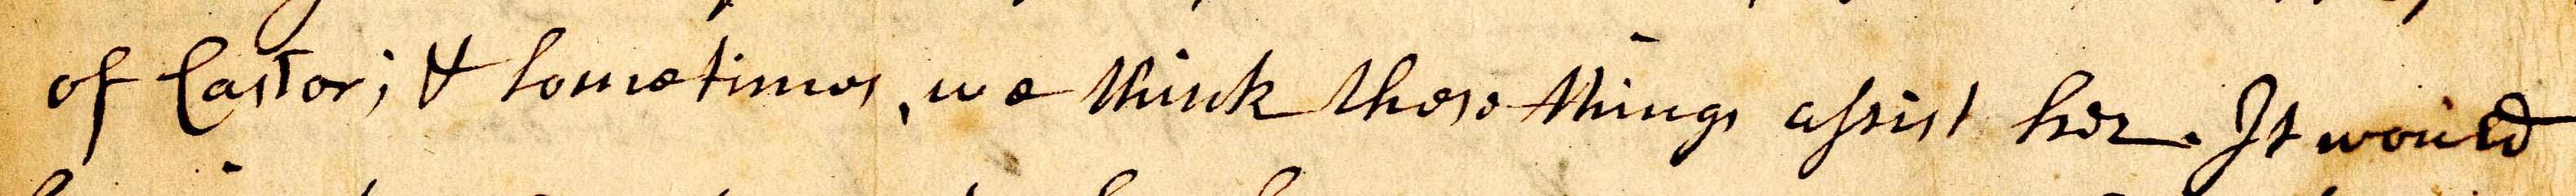of Castor; & sometimes, we think those things assist her. It would
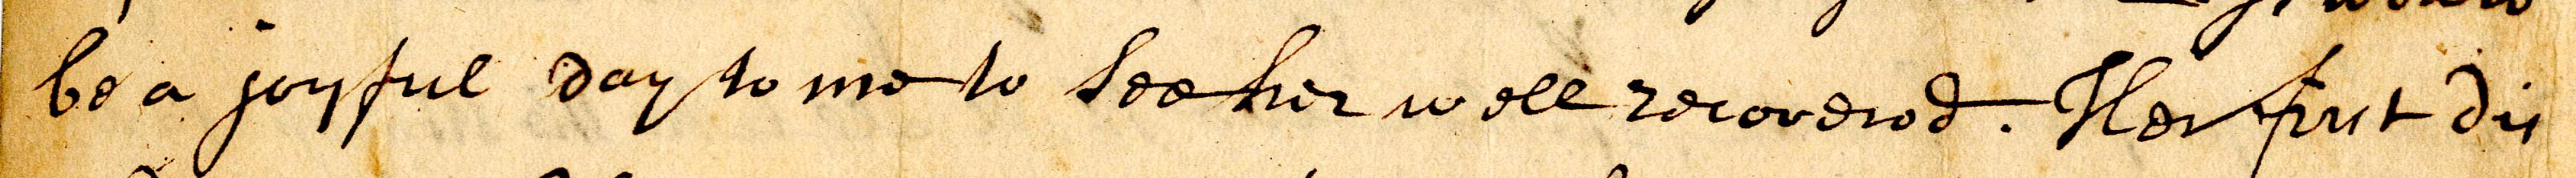be a joyful day to me to see her well recovered. Her first dis
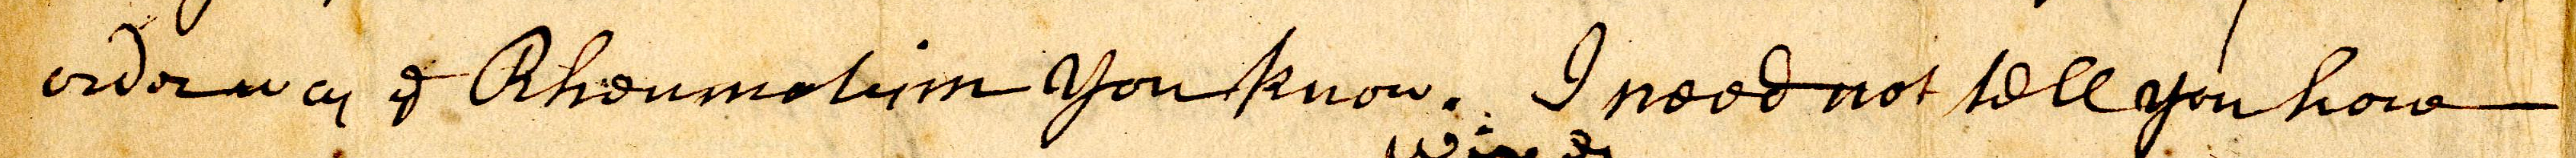order was y^e Rheumatism You know. I need not tell you how
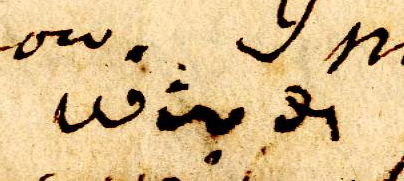winds
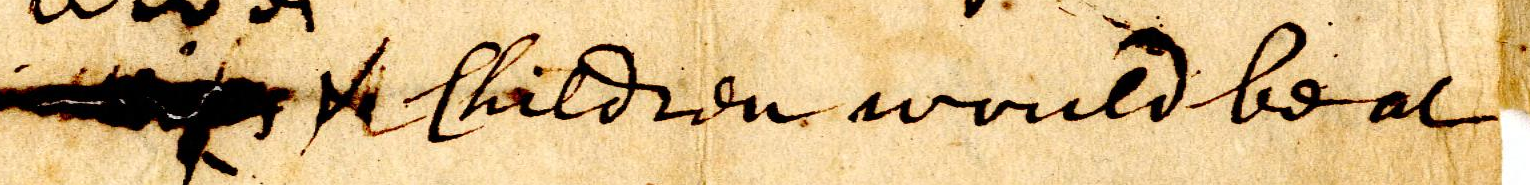[__] Children would be al
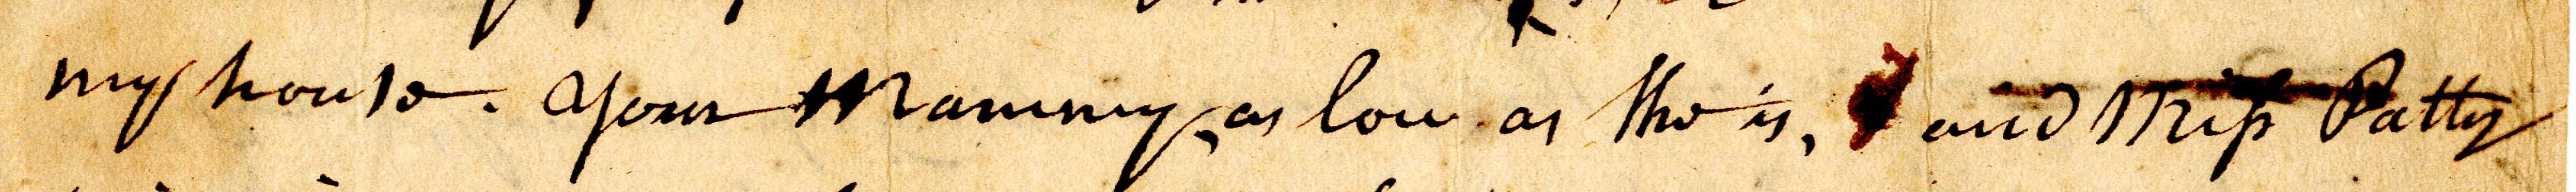my house. Your Mammy as low as she is, and Miss Patty
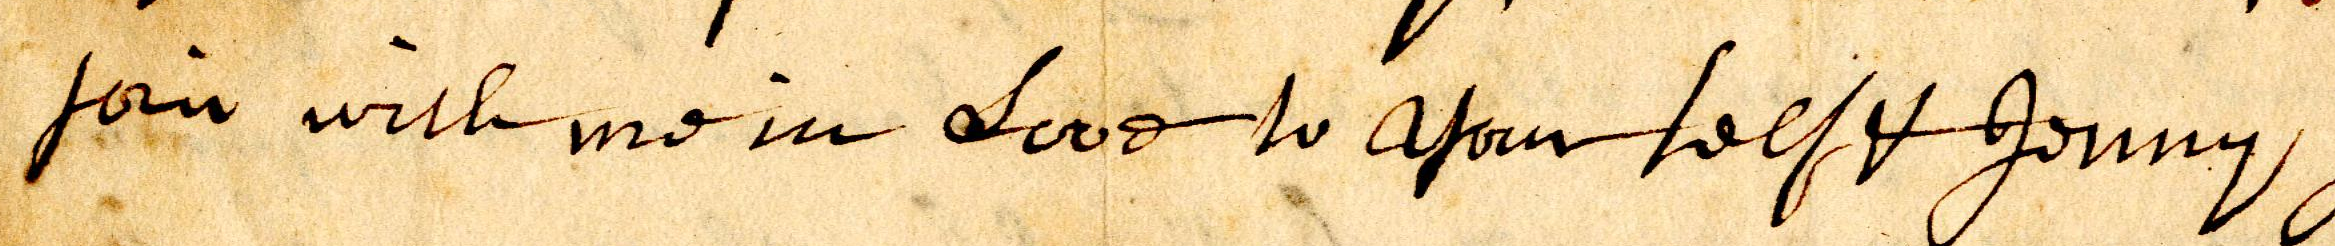join with me in Love to Your self & Jenny
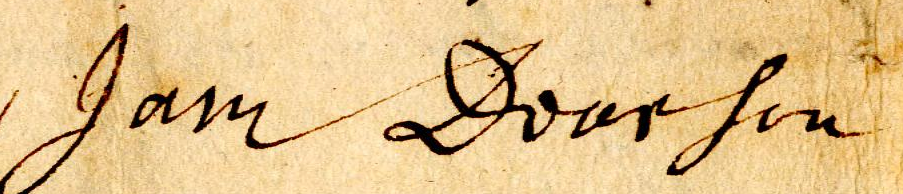I am Dear Son
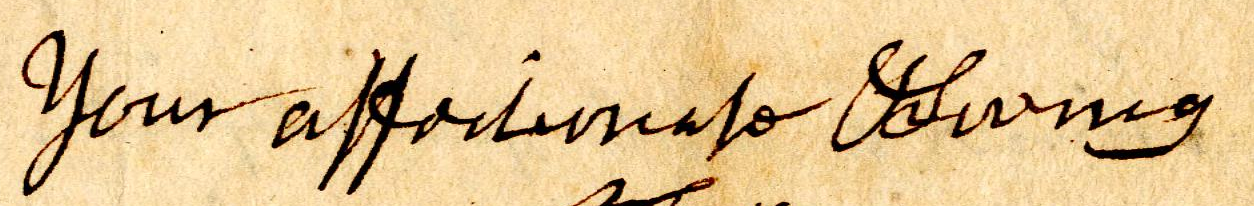Your affectionate & Loving
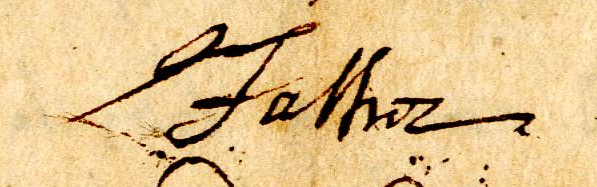Father
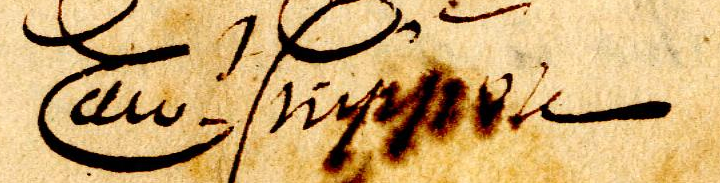Edw. Shippen
